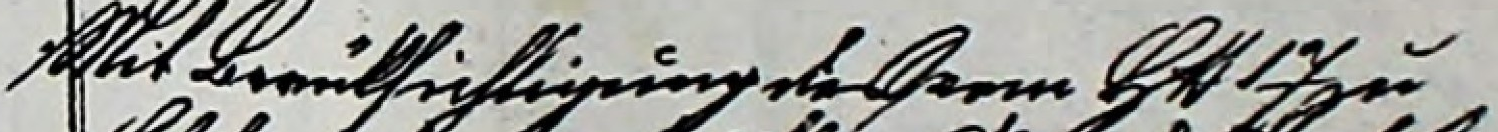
Mit Berücksichtigung des vom Hn 17 zu
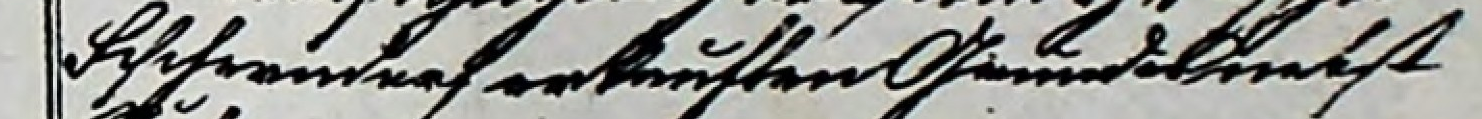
Schchernderferkausten Gmundesnebst
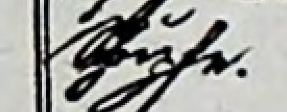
??ufe.
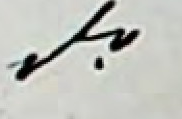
do
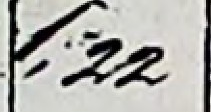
1,22
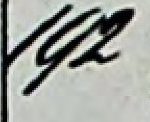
192
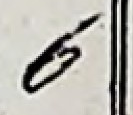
6
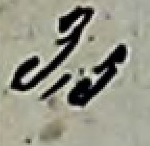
3,5
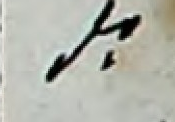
do
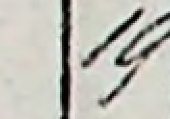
19
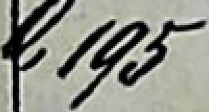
0,195
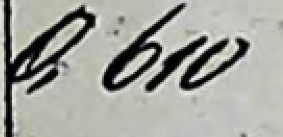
0,610
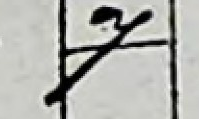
7
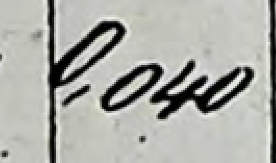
0,040
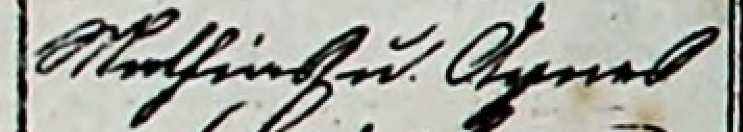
Mathias u. Arnes
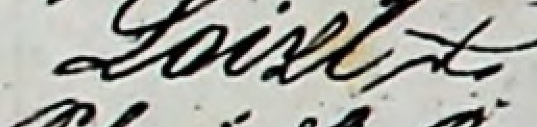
Loisel v
